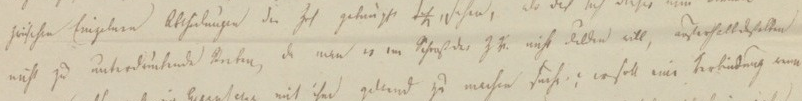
nicht zu unterdrückende Streben, da man es im Schooß des Z.V. nicht dulden will, außerhalb desselben
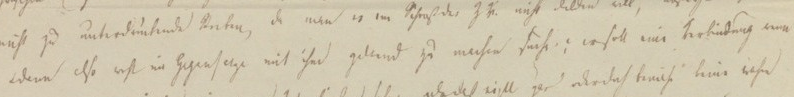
denn also erst im Gegensatze mit ihm geltend zu machen suche; er soll eine Verbindung wenn
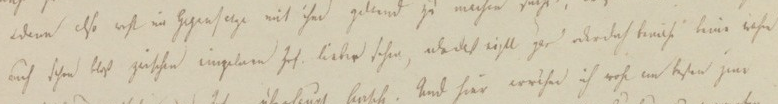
auch schon bloß zwischen einzelnen Zof. lieber sehen, als daß eigtl. gar oder doch beinahe keine wahre
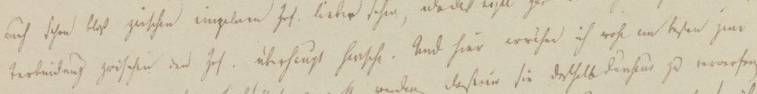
Verbindung zwischen den Zof. überhaupt herrsche. Und hier erwähne ich noch am besten jene
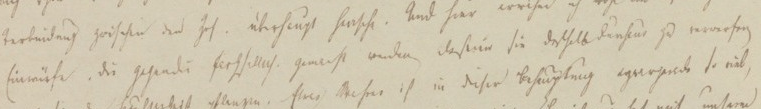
Einwürfe, die gegen die FacGsellsch. gemacht werden, da seien sie deshalb durchaus zu verwerfen,
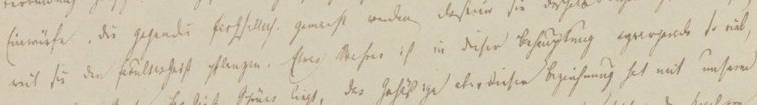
weil sie den FaculttsGeist pflanzen. Etw. Wahres ist in dieser Behauptung & zwar gerade so viel,
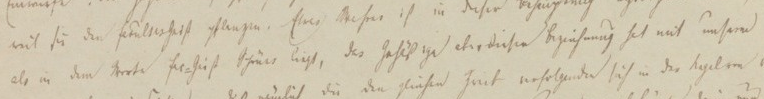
als in dem Worte Fac-Geist Schönes liegt, das Gehäßige eben dieser Bezeichnung hat mit unserm
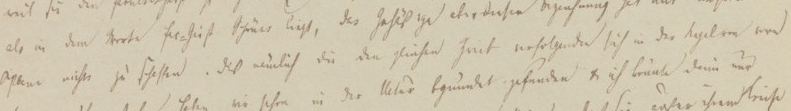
Plane nichts zu schaffen. Daß nämlich die den gleichen Zweck verfolgenden sich in der Regel von vorn
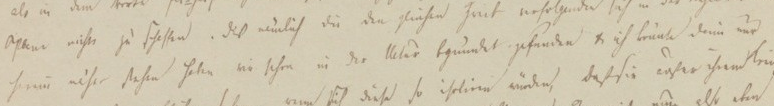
herein näher stehen haben wir schon in der Natur begründet gefunden & ich könnte darin nur
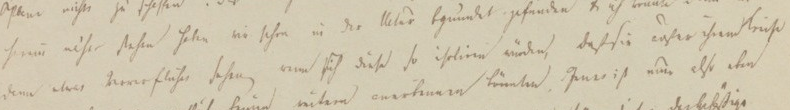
dann etwas Verwerfliches sehen, wenn sich diese so isoliren würden, daß sie außer ihrem Kreise
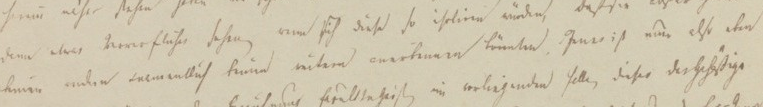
keinen andern & namentlich keinen weitern anerkennen könnten. Jenes ist nun also eben
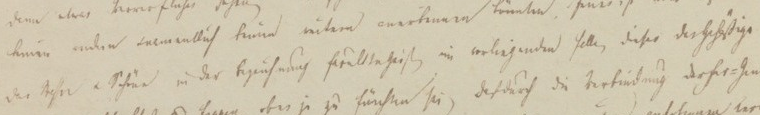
das Wahre & Schöne in der Bezeichnung FaculttnGeist, im vorliegenden Falle, dieses das Gehäßige.
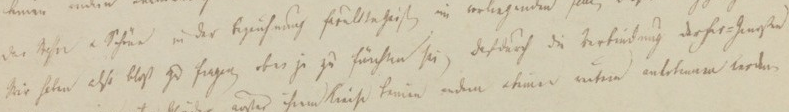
Wir haben also bloß zu fragen, ob es je zu fürchten sei, daß durch die Verbindung der Fac-Genossen
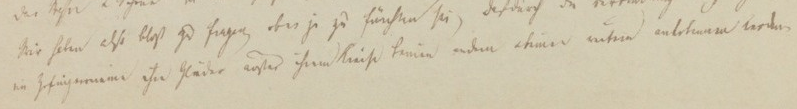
im Zofingerverein ihre Glieder außer ihrem Kreise keinen andern & keinen weitern anerkennen werden.
